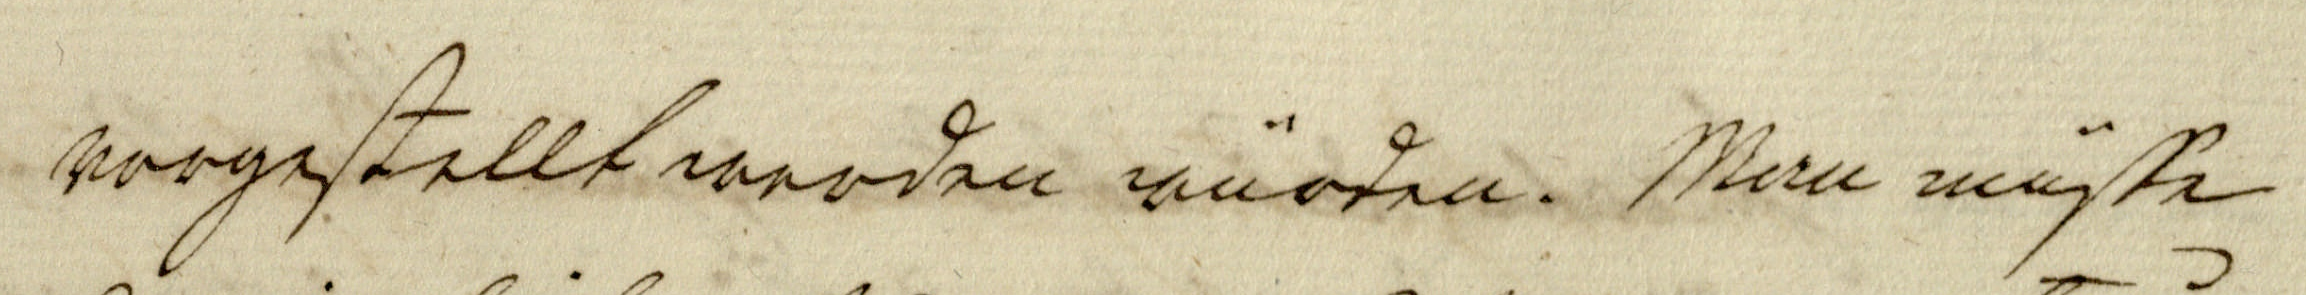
vorgestellt werden würden. Man müsse
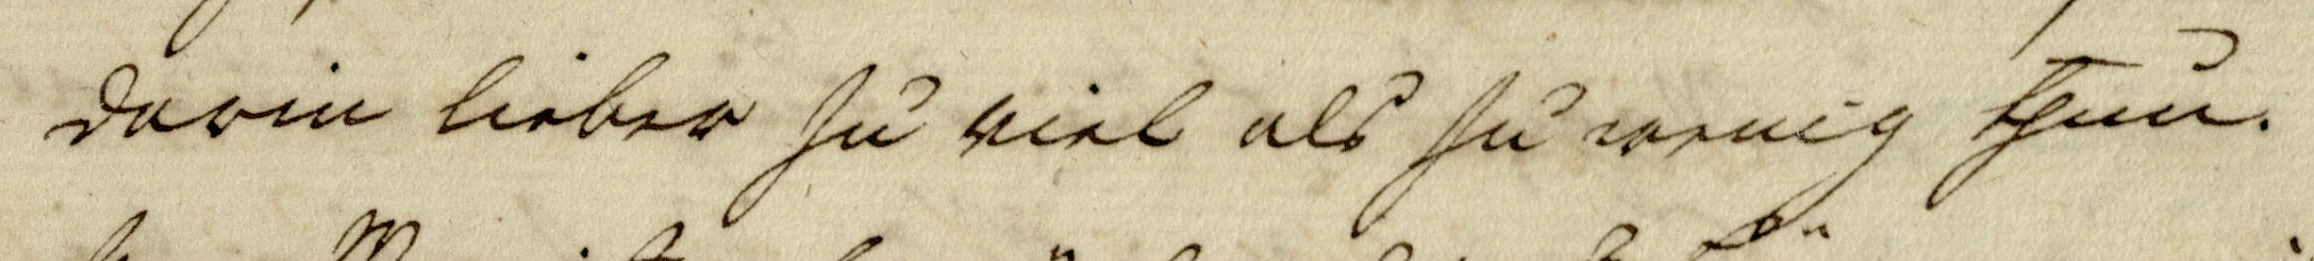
darin lieber zu viel als zu wenig thun.
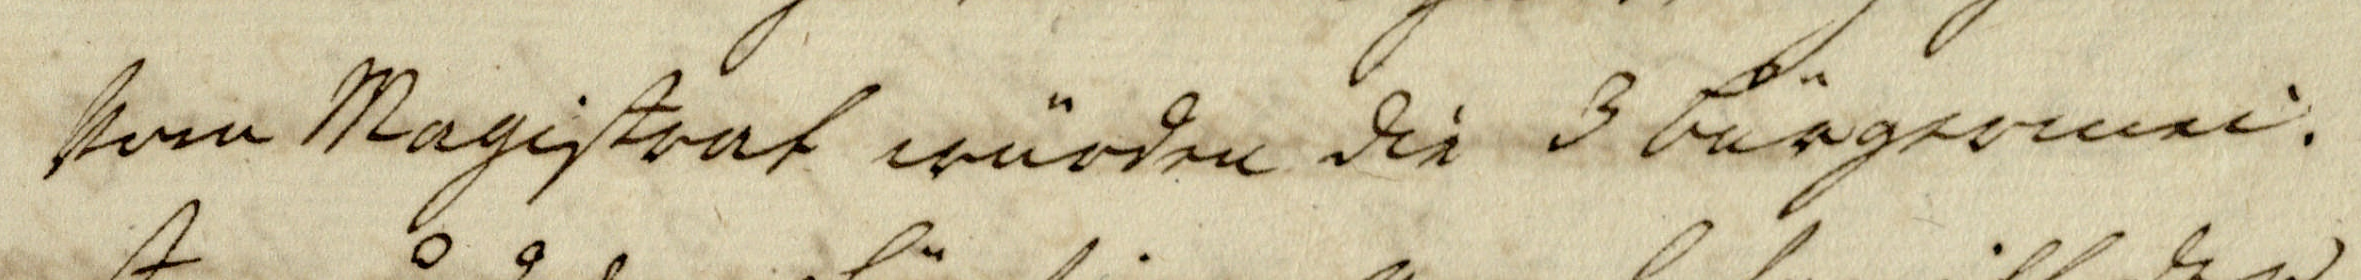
Vom Magistrat würden die 3 Bürgermei¬
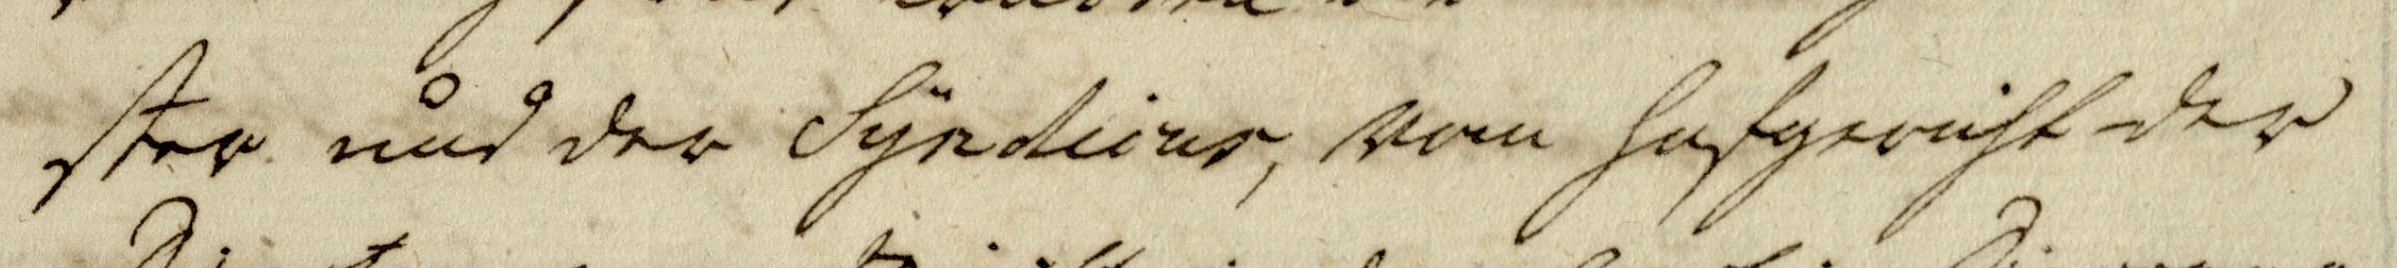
ster und der Sÿndicus, vom Hofgericht der
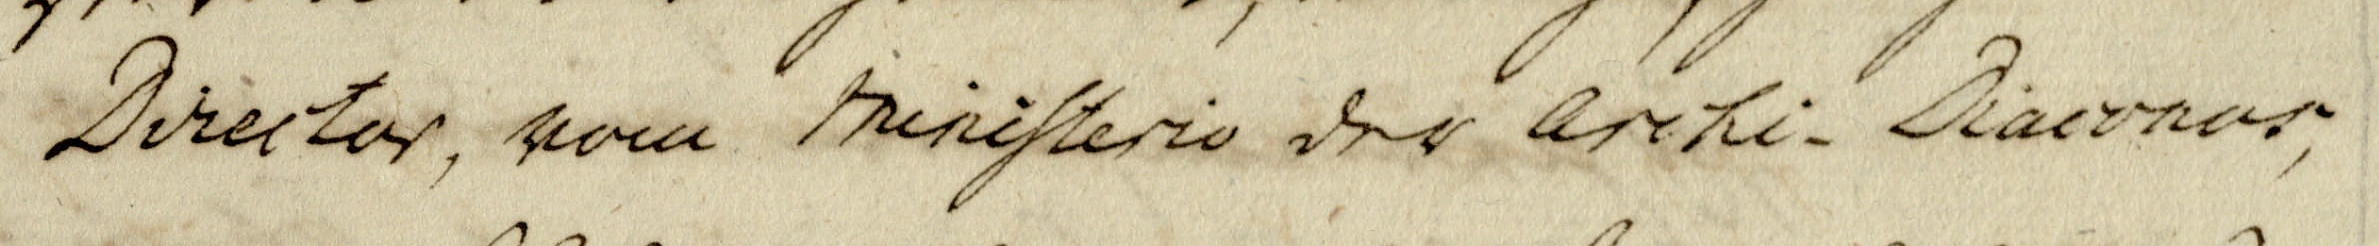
Director, vom Ministerio der Archi- Diaconus,
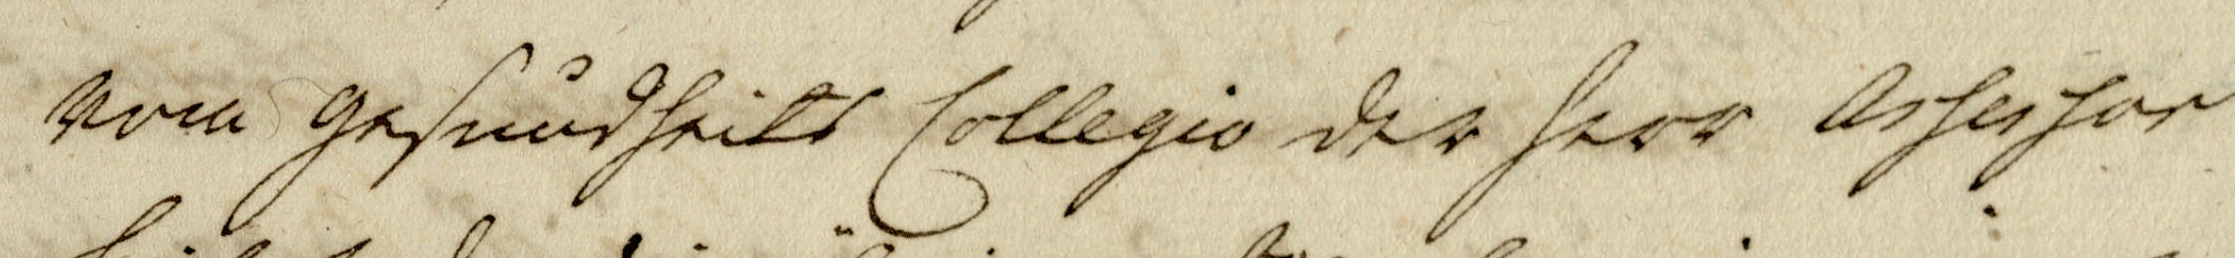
vom Gesundheits Collegio der Herr Assessor
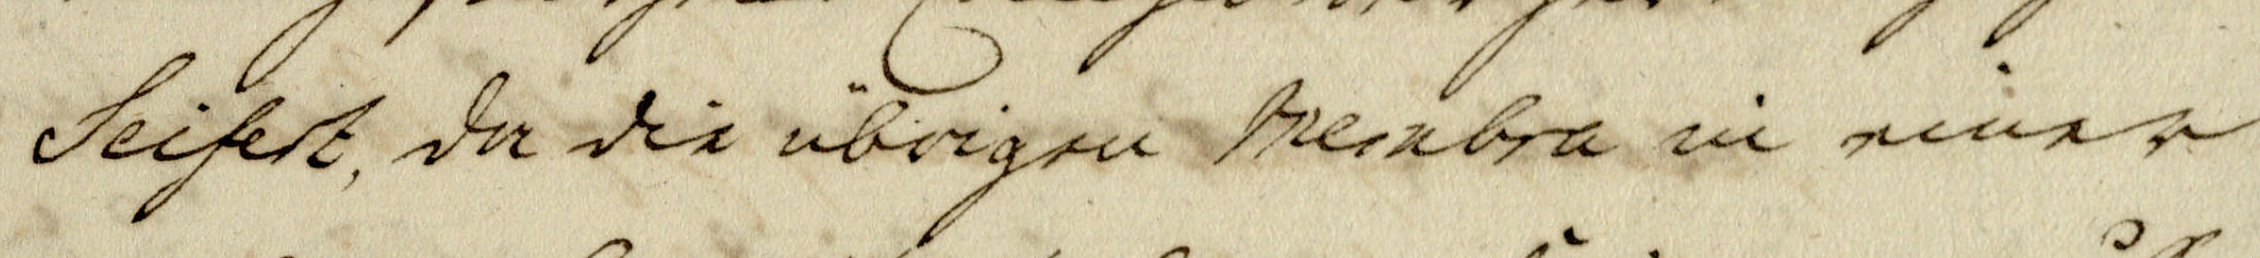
Seifert, da die übrigen Membra in einer
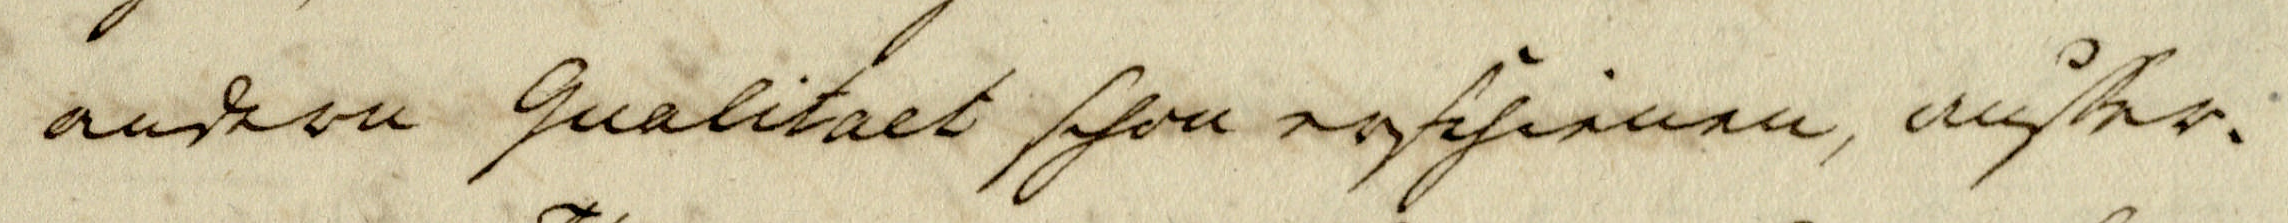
andern Qualitaet schon erschienen, ausser¬
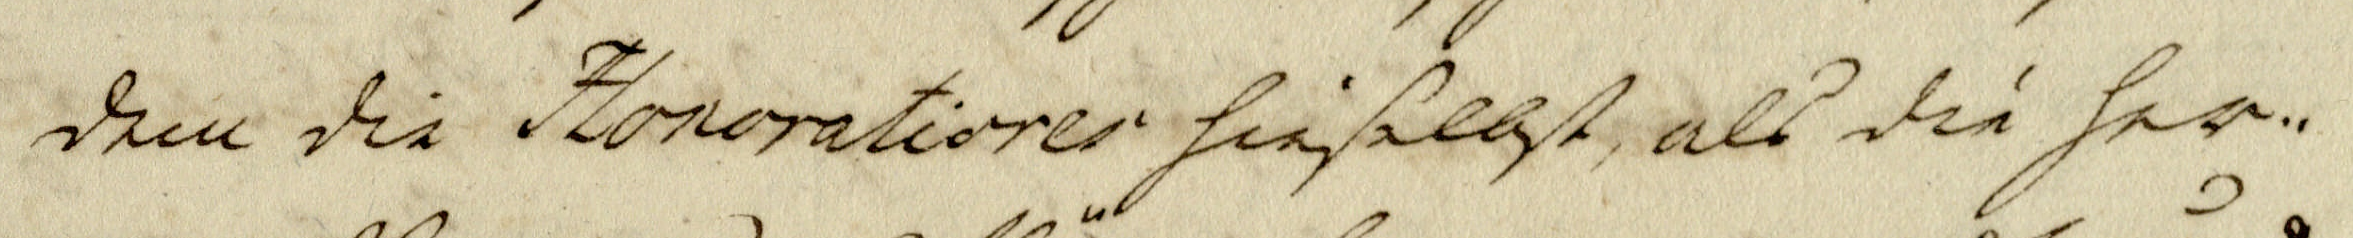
dem die Honoratiores hieselbst, als die Her¬
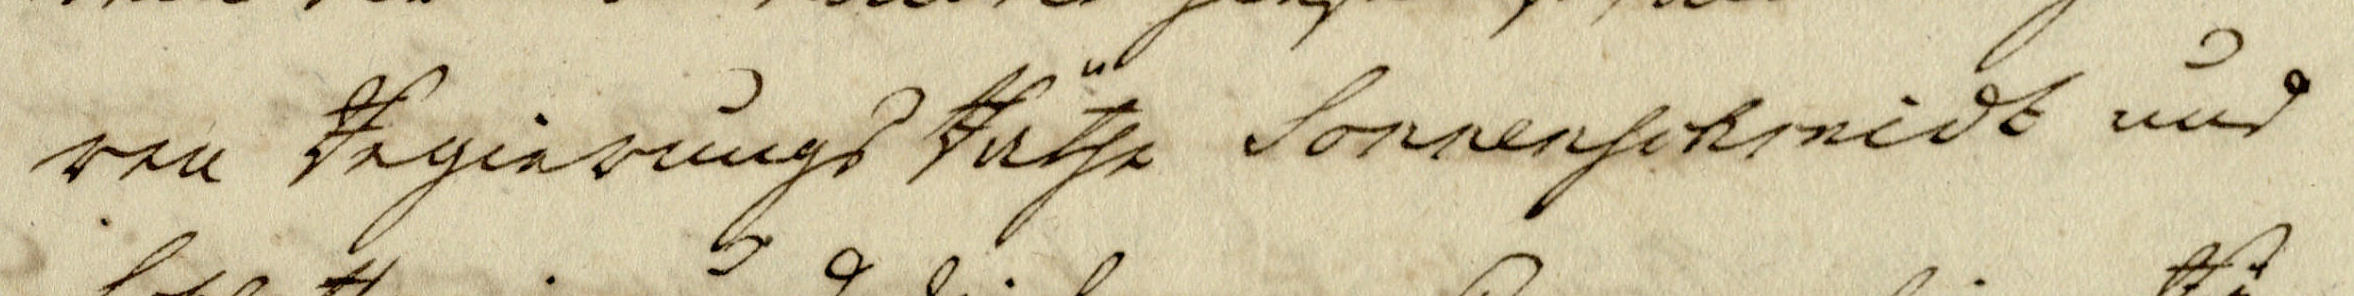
ren Regierungs Rathe Sonnenschmidt und
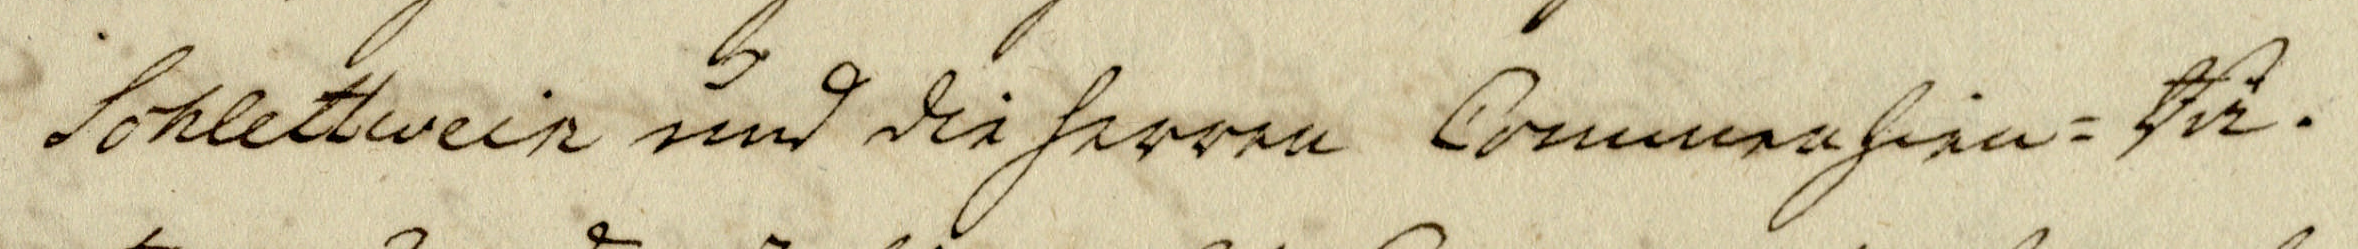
Schlettwein und die Herren Commerzien- Rä¬
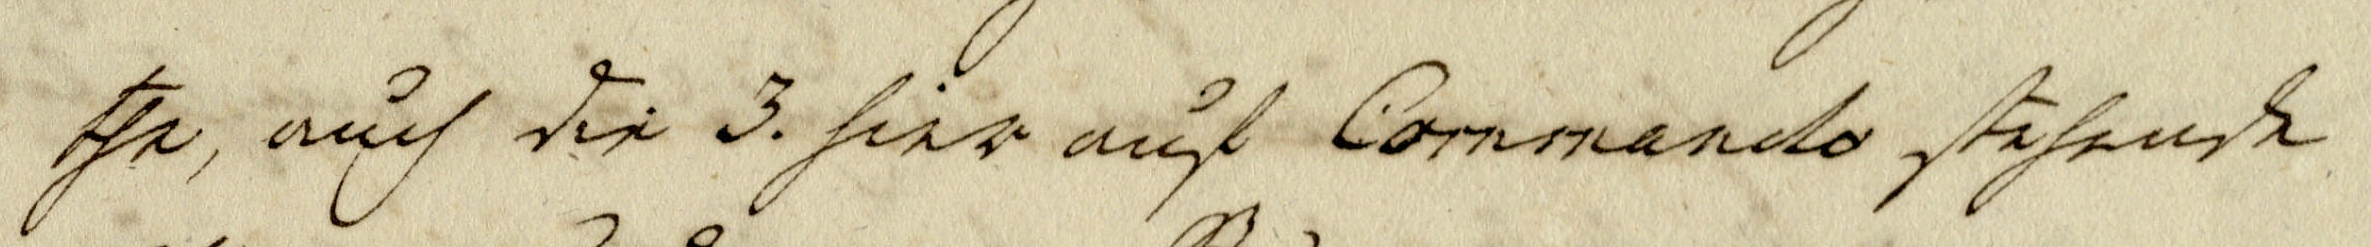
the, auch die 3. hier auf Commando stehende
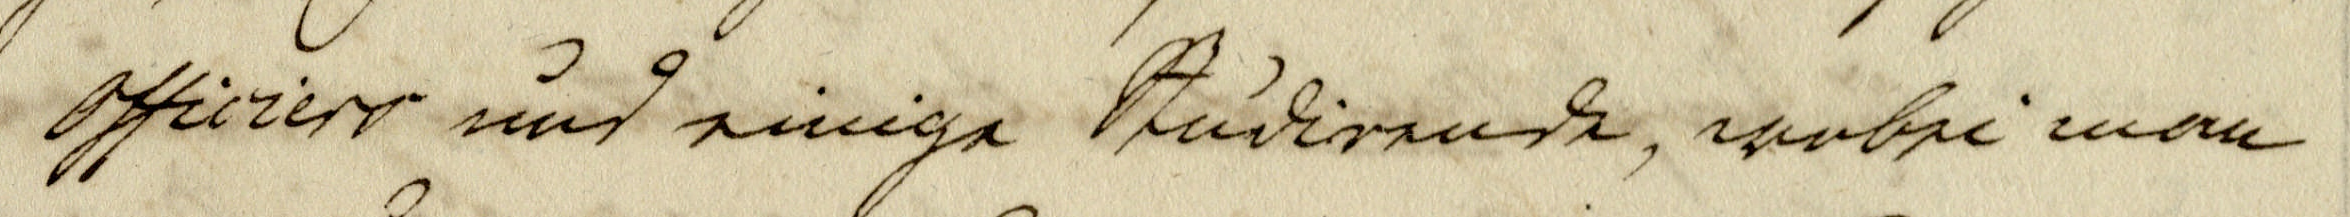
Officiers und einige Studirende, wobei man
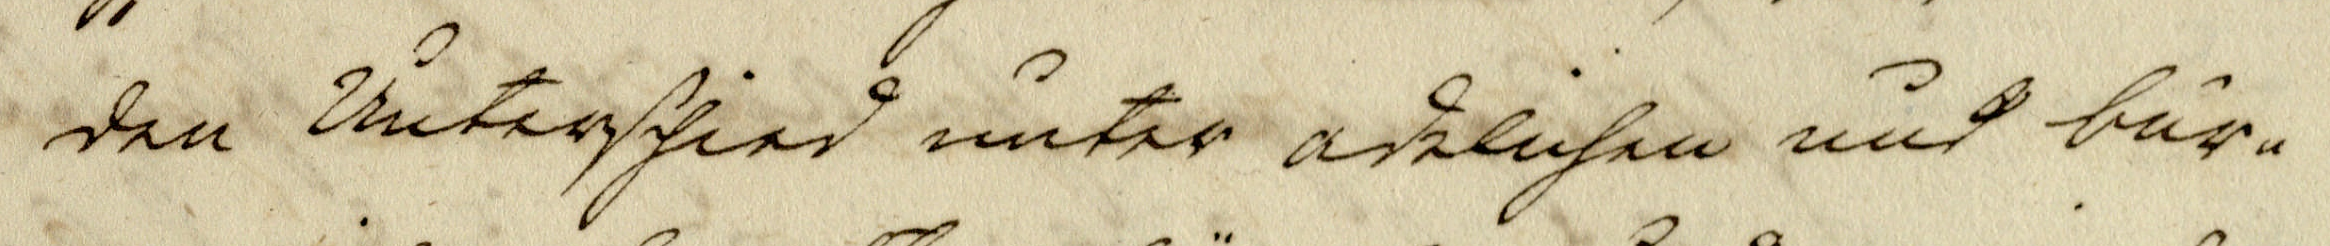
den Unterschied unter adelichen und bür¬
